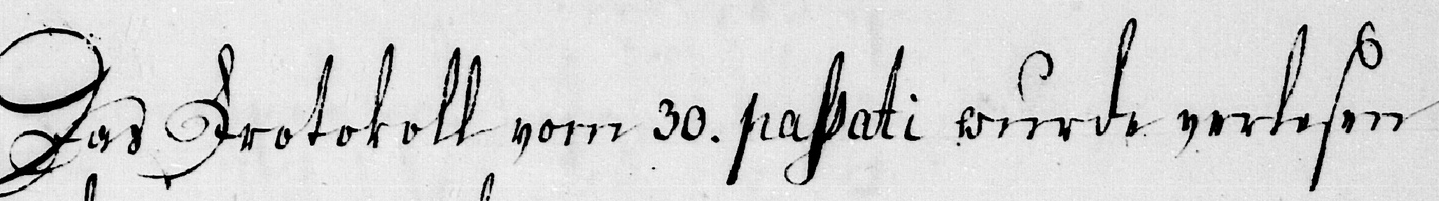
Das Protokoll vom 30. passati wurde verlesen
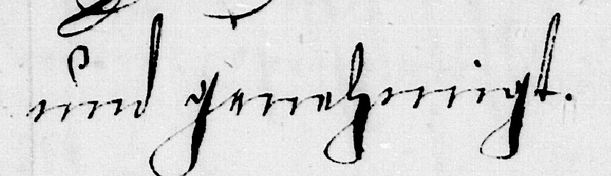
und genehmigt.
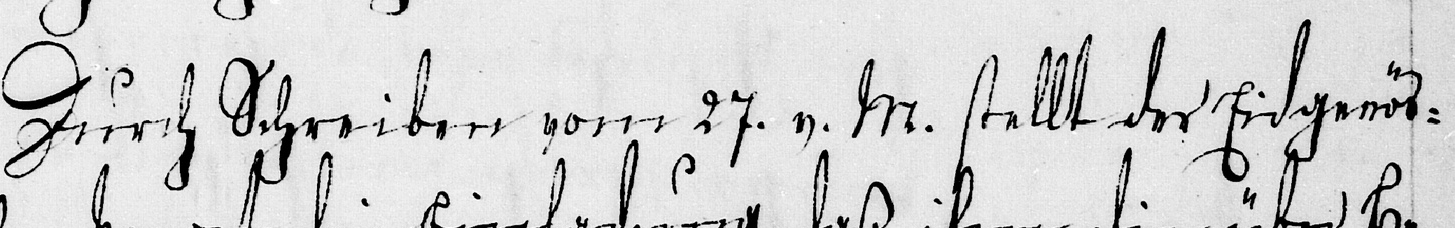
Durch Schreiben vom 27. d. M. stellt der Eidgenöß¬
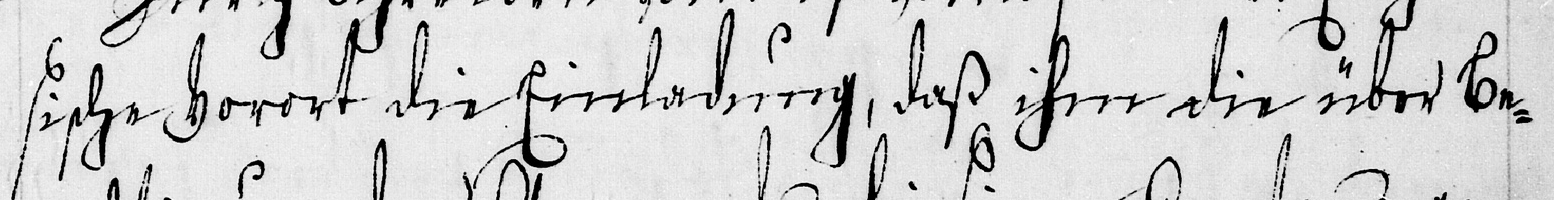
ische Vorort die Einladung, daß ihm die über Be¬
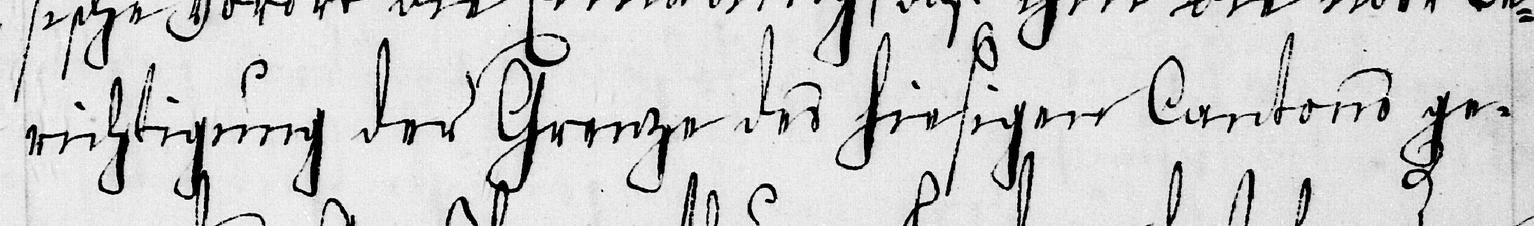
richtigung der Grenze des hiesigen Cantons ge¬
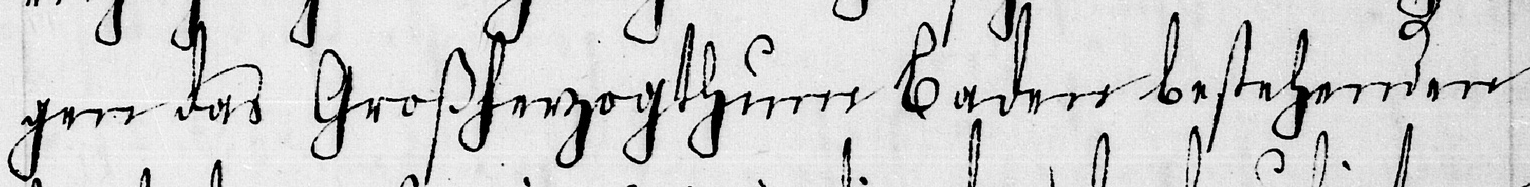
gen das Großherzogthum Baden bestehenden
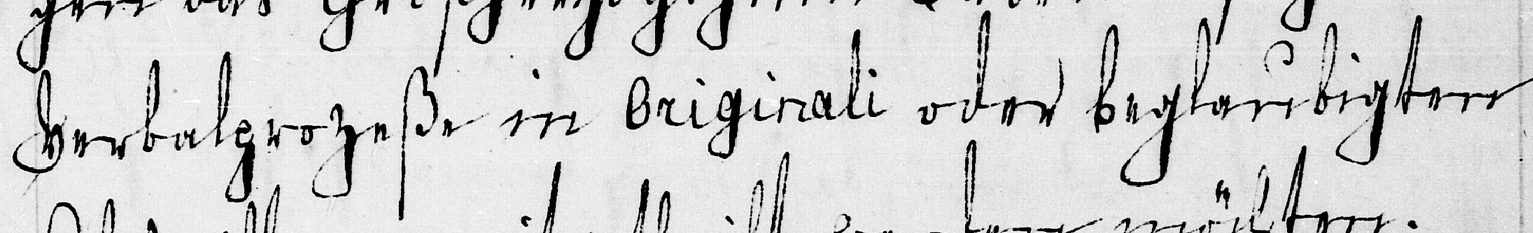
Verbalprozeße in originali oder beglaubigten
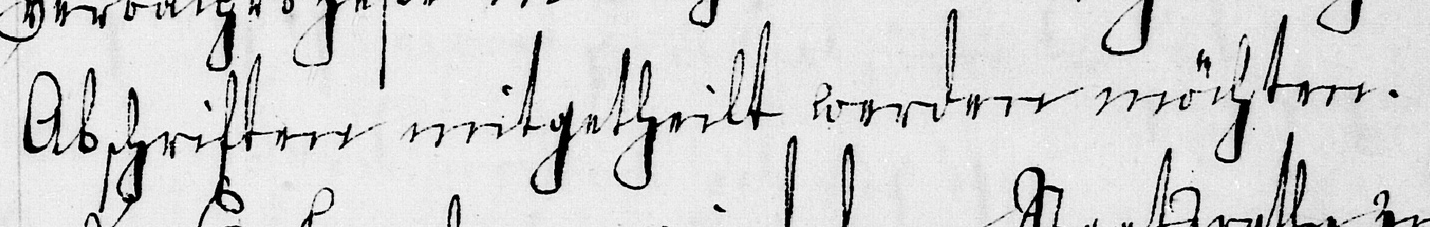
Abschriften mitgetheilt werden möchten.
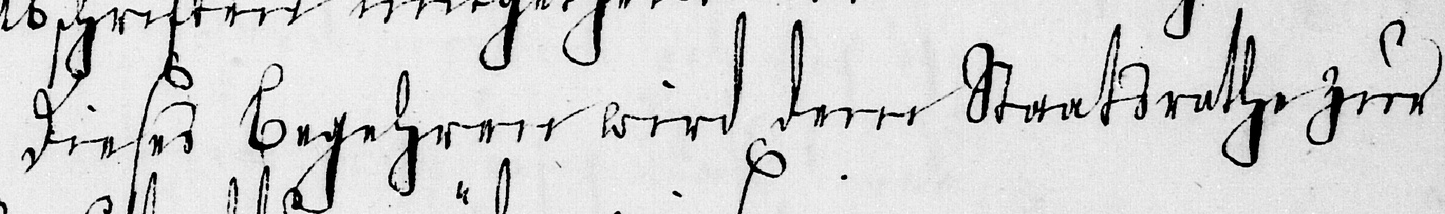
Dieses Begehren wird dem Staatsrathe zur
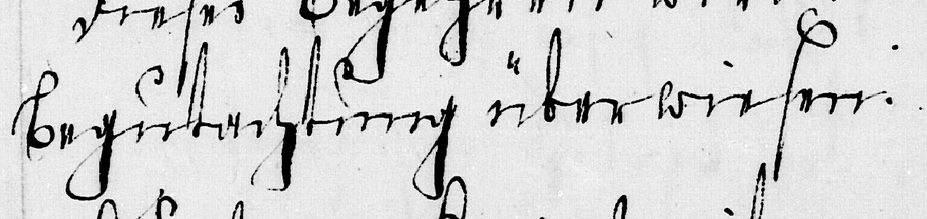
Begutachtung überwiesen.
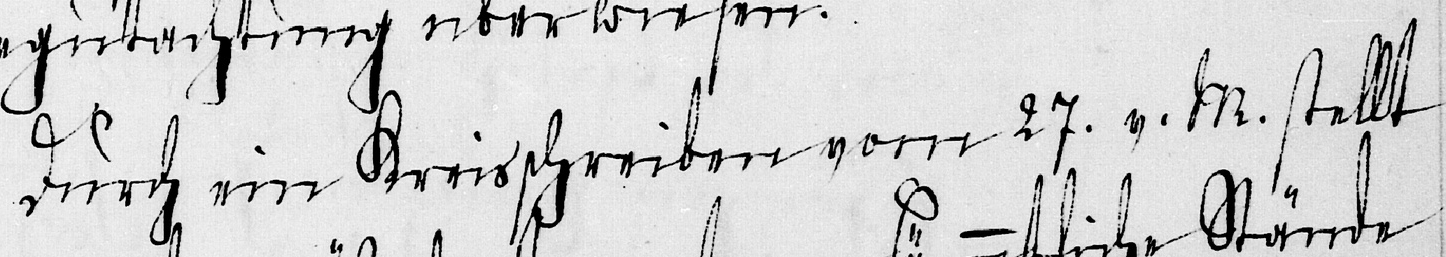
Durch ein Kreisschreiben vom 27. v. M. stellt
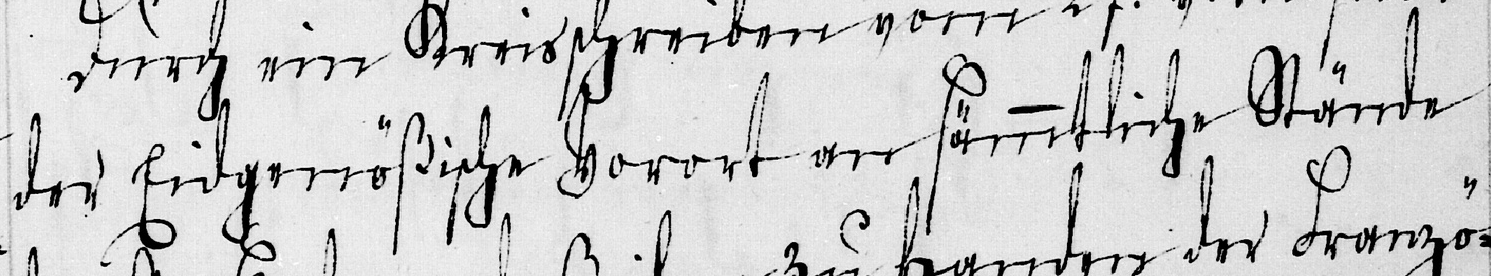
der Eidgenößische Vorort an sämmtliche Stände
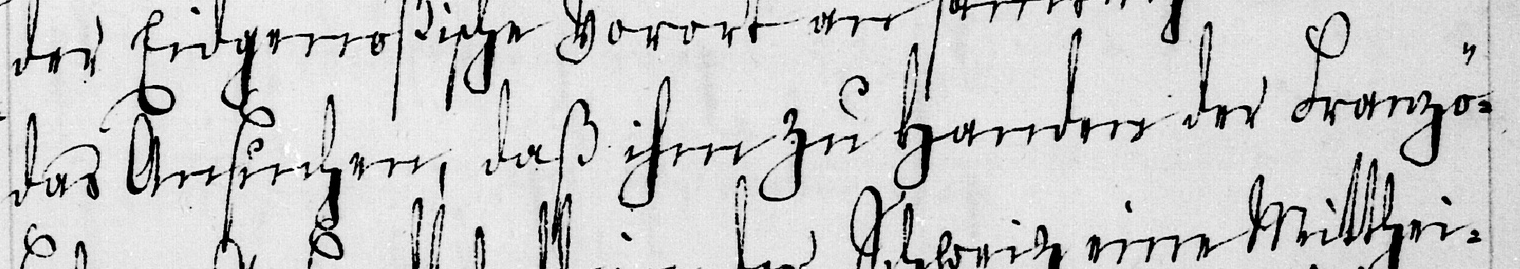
das Ansuchen, daß ihm zu Handen der Franzö¬
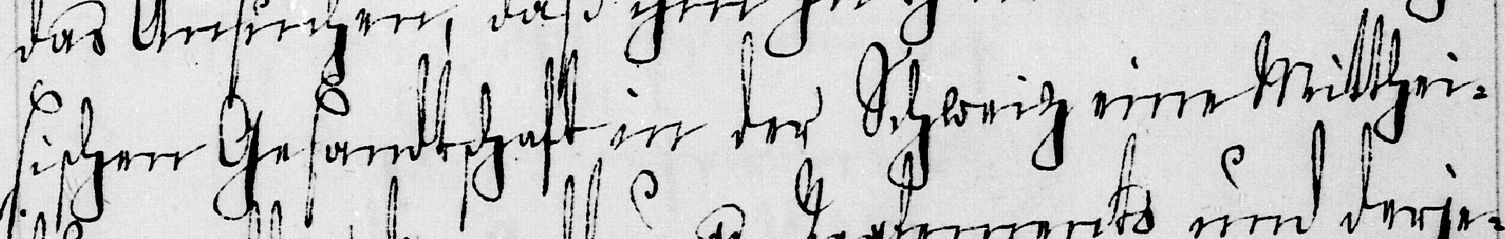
sischen Gesandtschaft in der Schweiz eine Mitthei¬
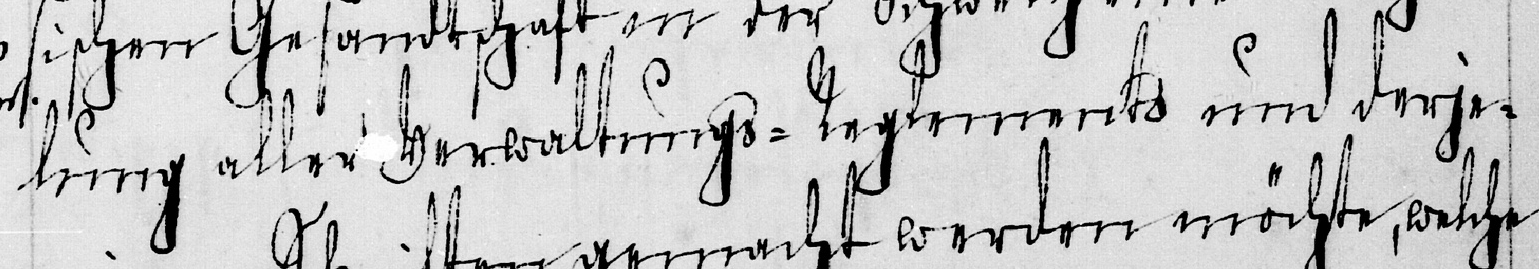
lung aller Verwaltungs-Reglements und derje¬
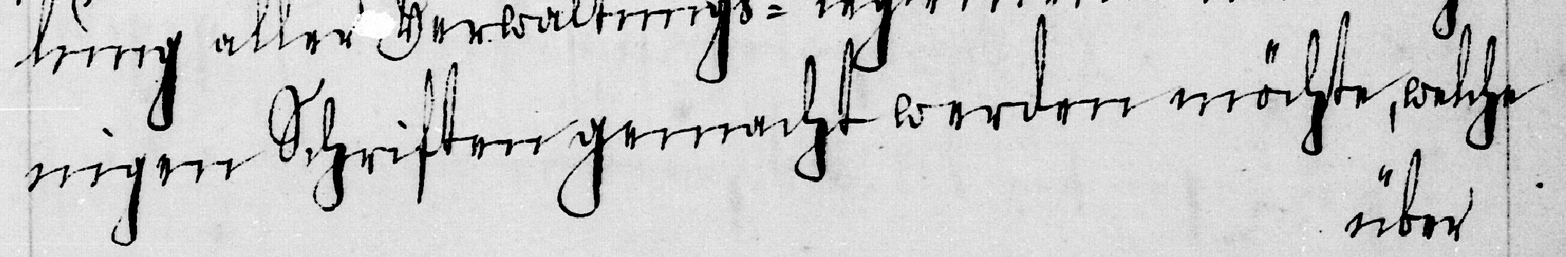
nigen Schriften gemacht werden möchte, welche
